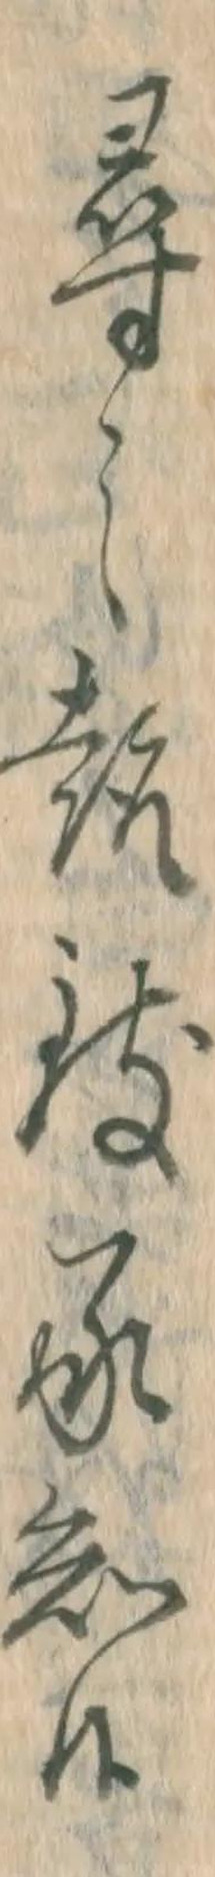尋之趣致承知候
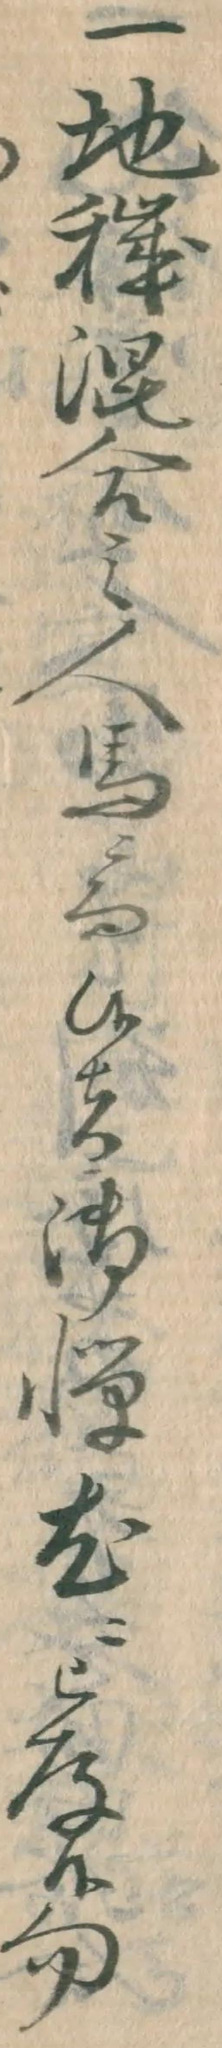一地穢混合之人馬ニ而候者御憚尤ニ被存候勿
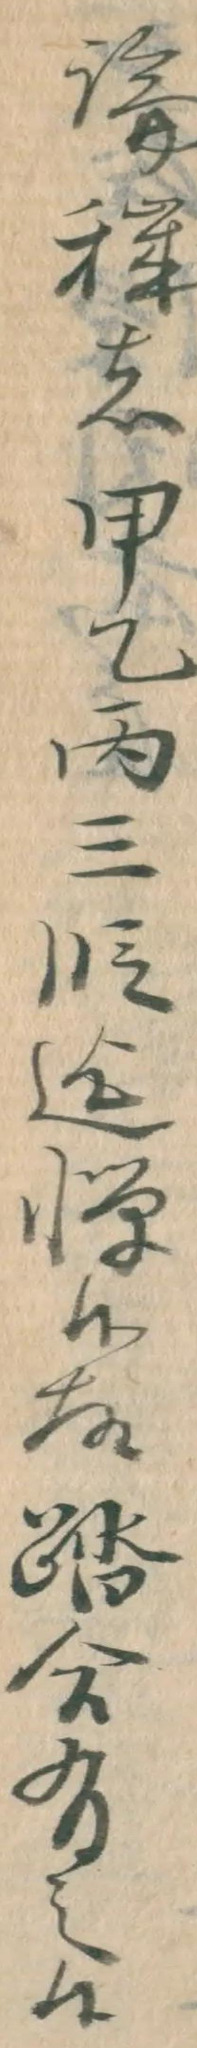論穢者甲乙丙三段迄憚候故踏合有之候

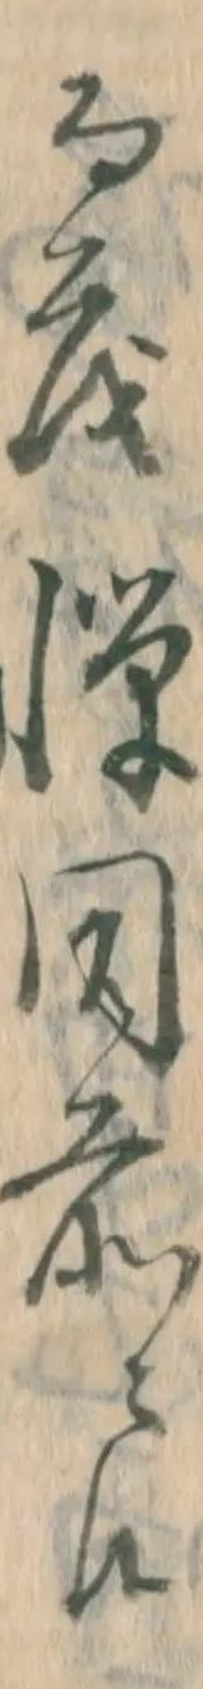而茂憚同前ニ候
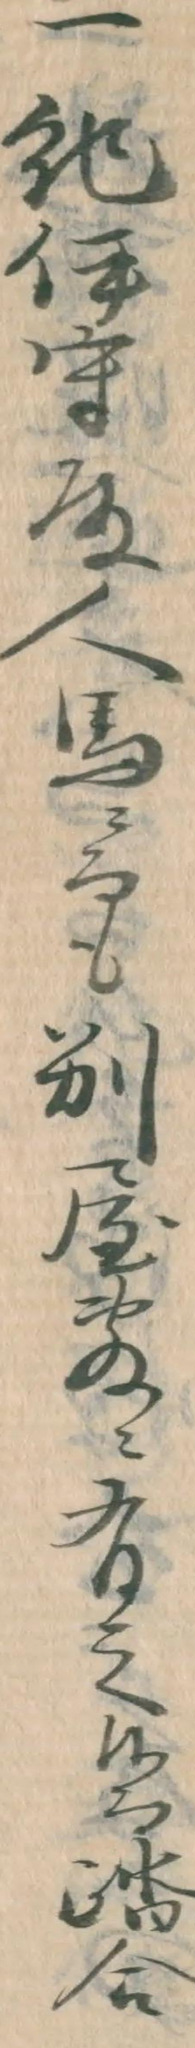一紀伊守殿人馬ニ而も別屋敷ニ有之候而踏合
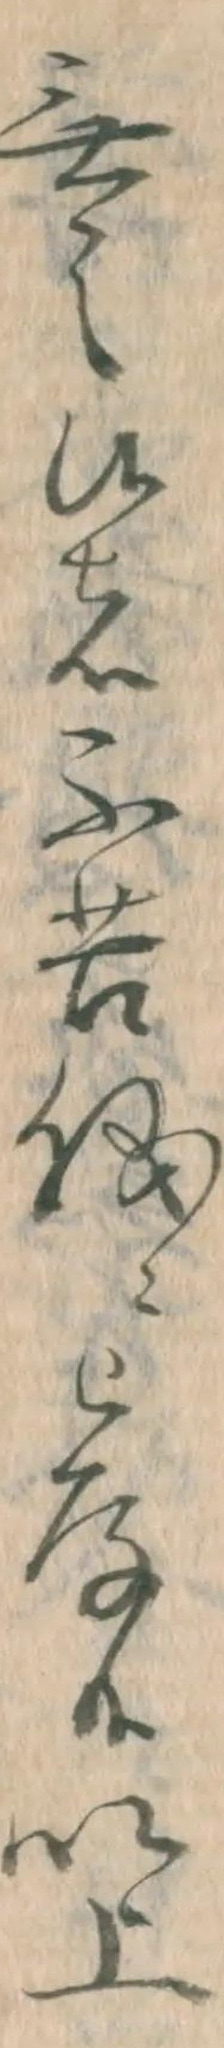無之候者不苦儀ニ被存候以上
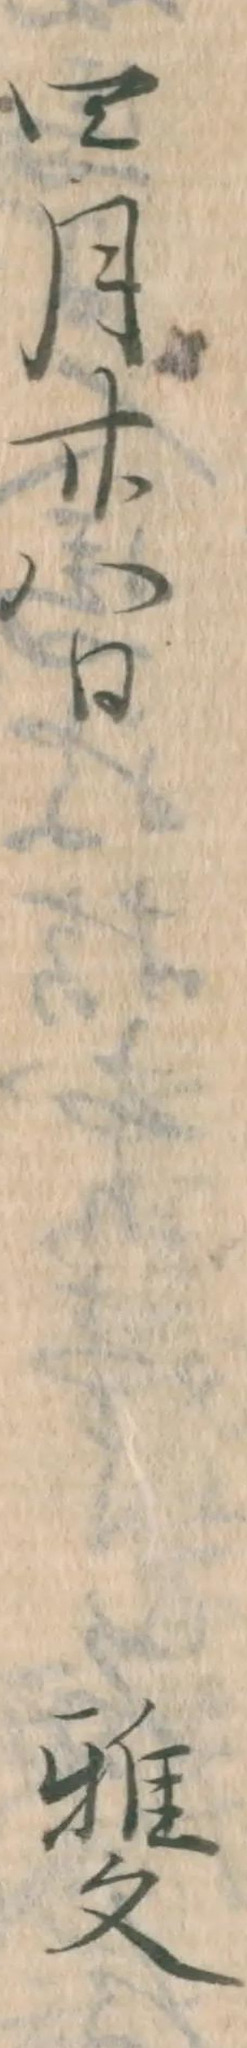四月廿八日雅文
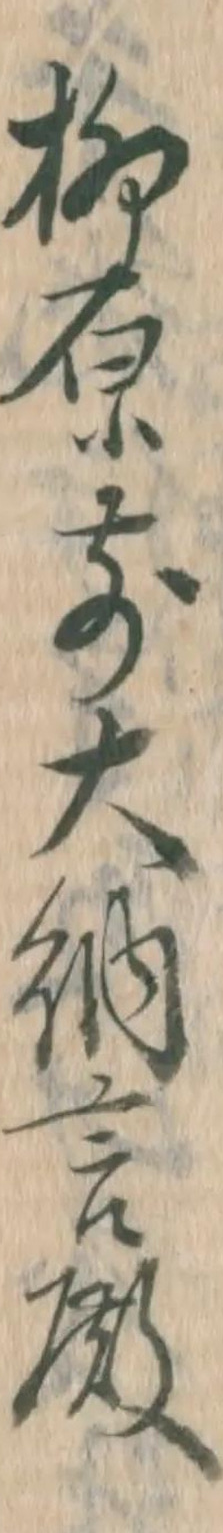柳原前大納言殿
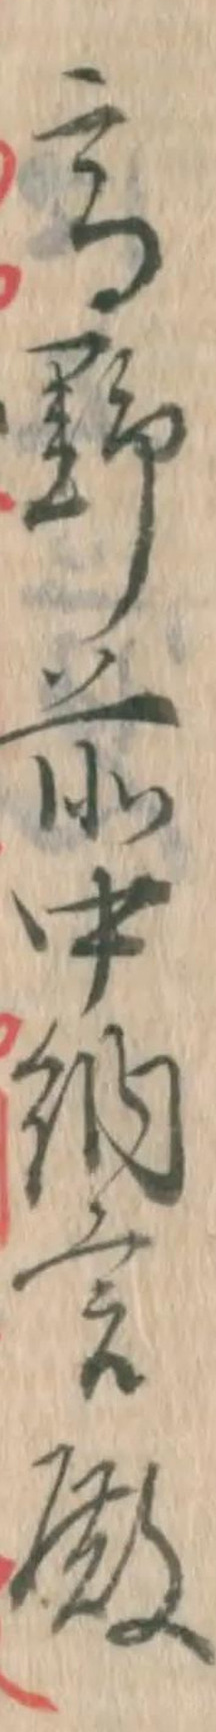高野前中納言殿
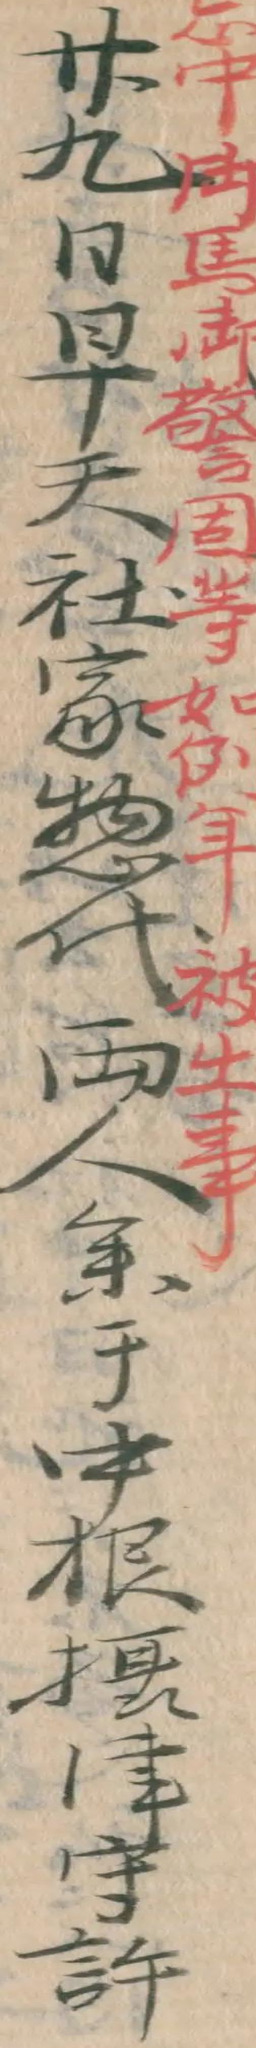廿九日早天社家惣代両人参于中根摂津守許
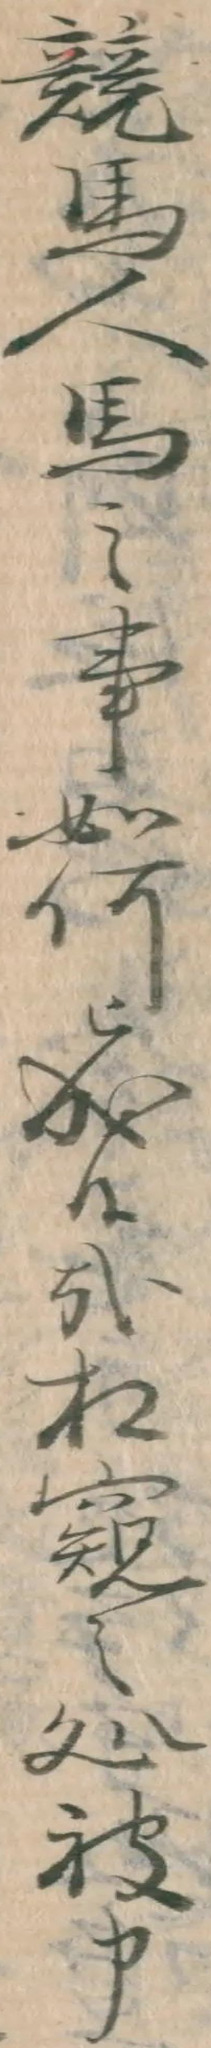競馬人馬之事如何被成候哉相窺之処被申
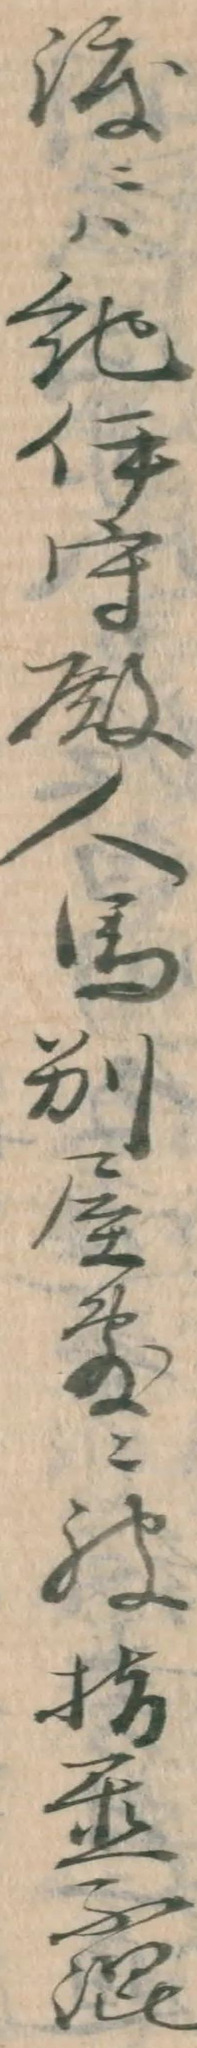渡ニハ紀伊守殿人馬別屋敷ニ被指置不混
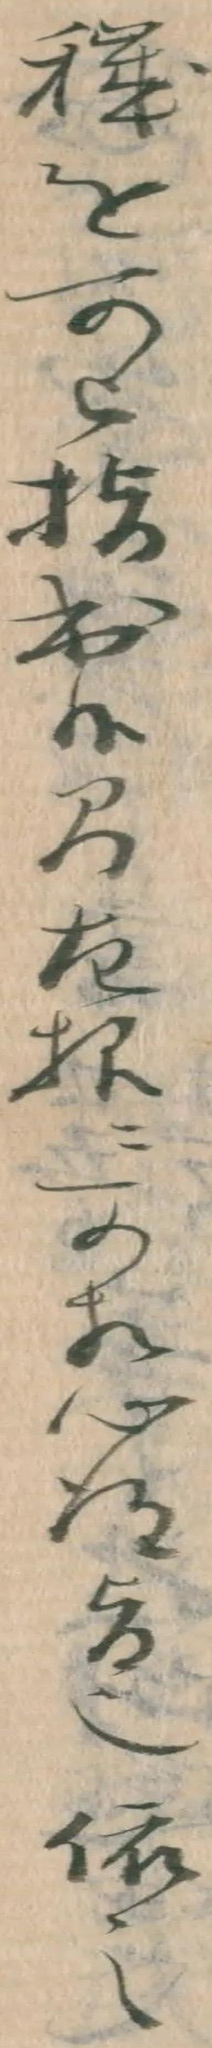穢を可被指出候間左様ニ可相心得旨也依之
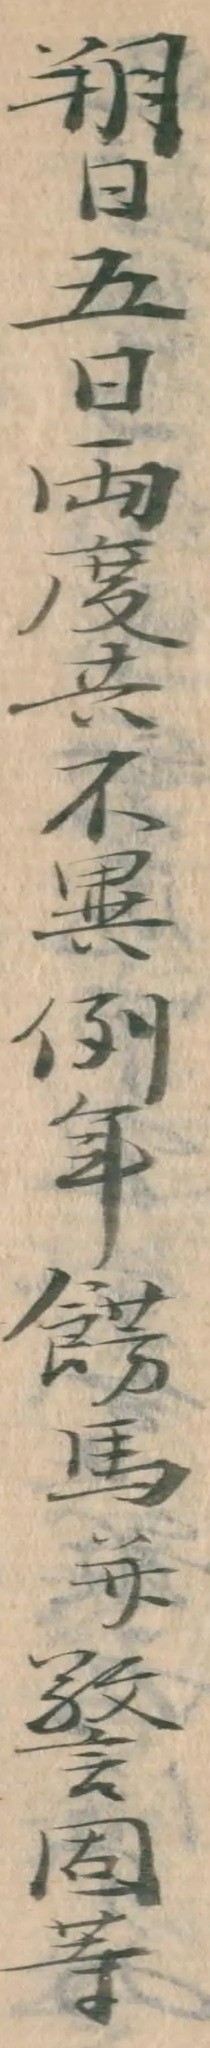朔日五日両度共不異例年餝馬并警固等
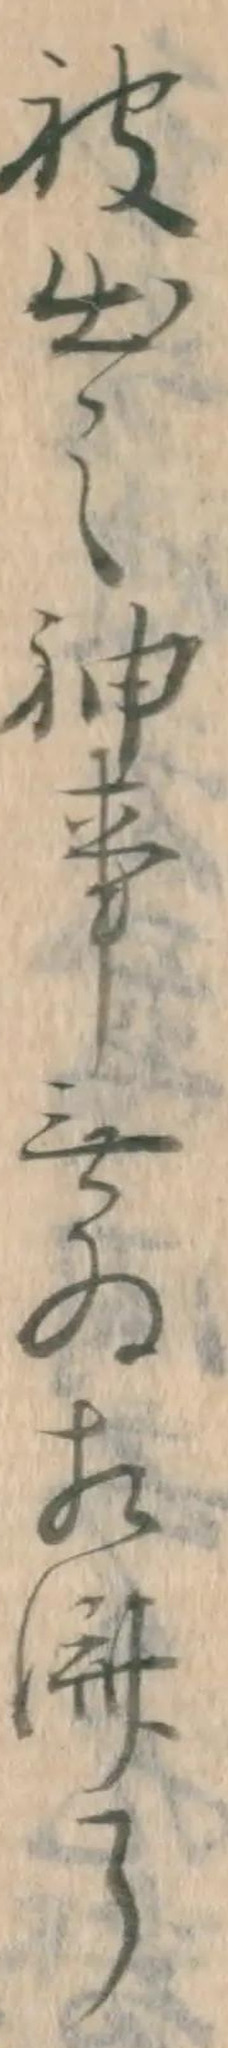被出之神事無為相済了
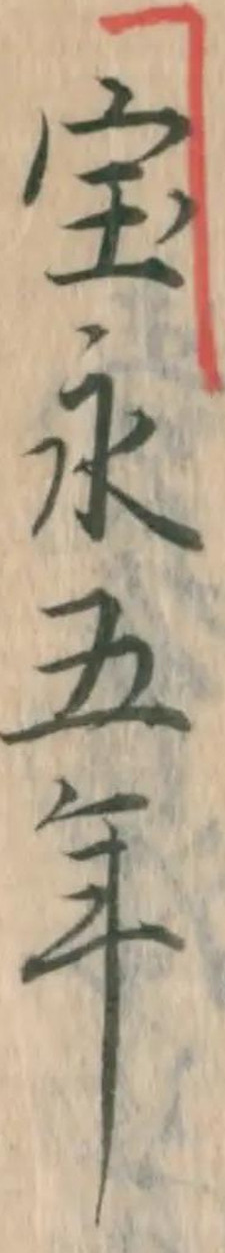宝永五年
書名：賀茂社記録. 第10冊
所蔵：国立国会図書館 National Diet Library, JAPAN
